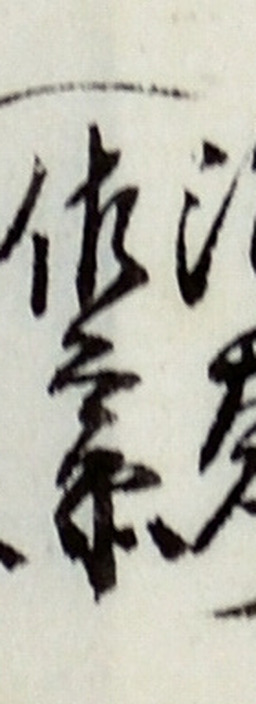佐兵衛
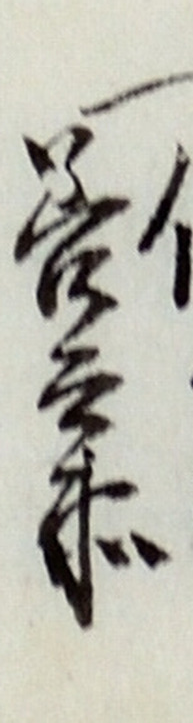善兵衛
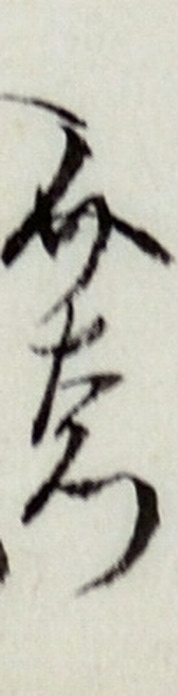孫右衛門
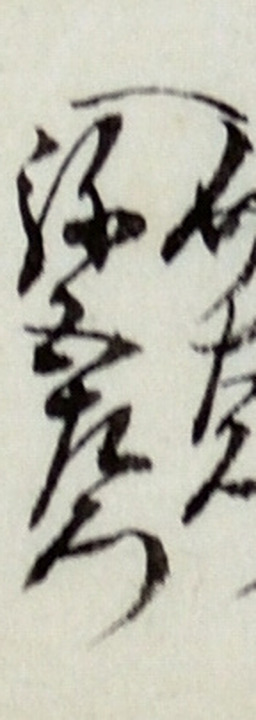弥五左衛門
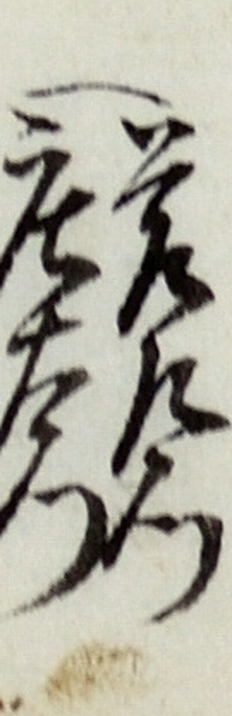孫右衛門
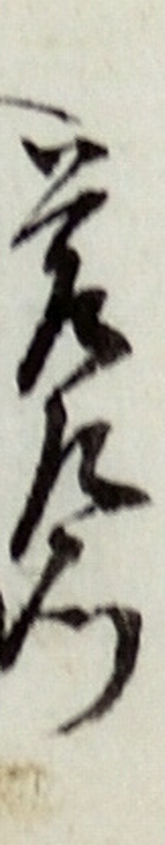杢左衛門
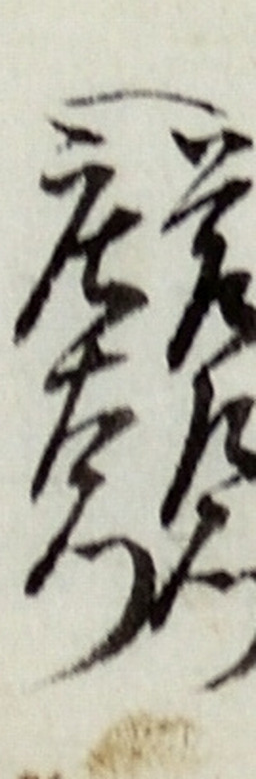孫右衛門
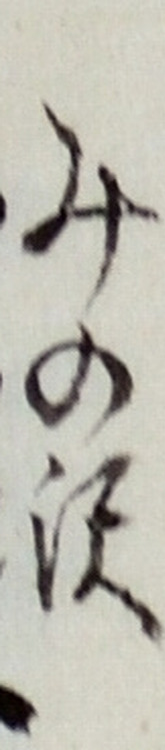みの沢
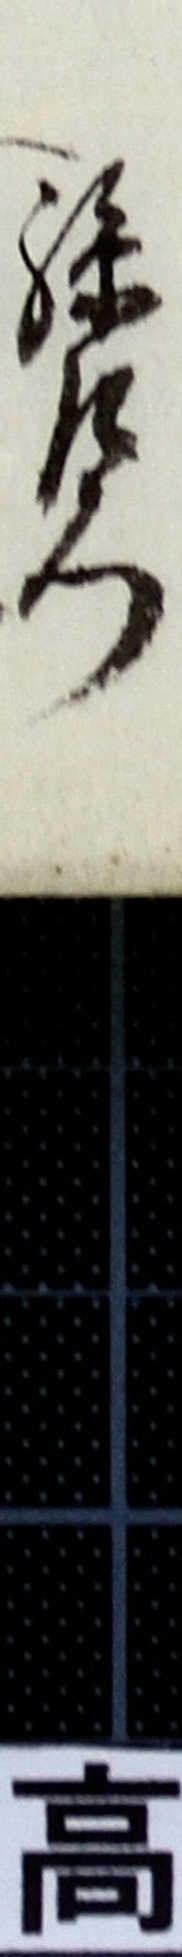杢左衛門
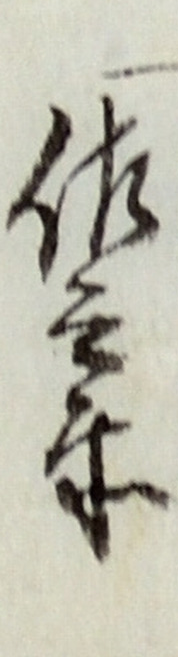佐兵衛
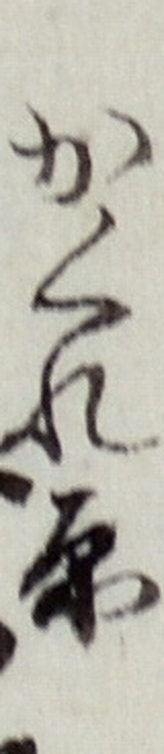かくれ原
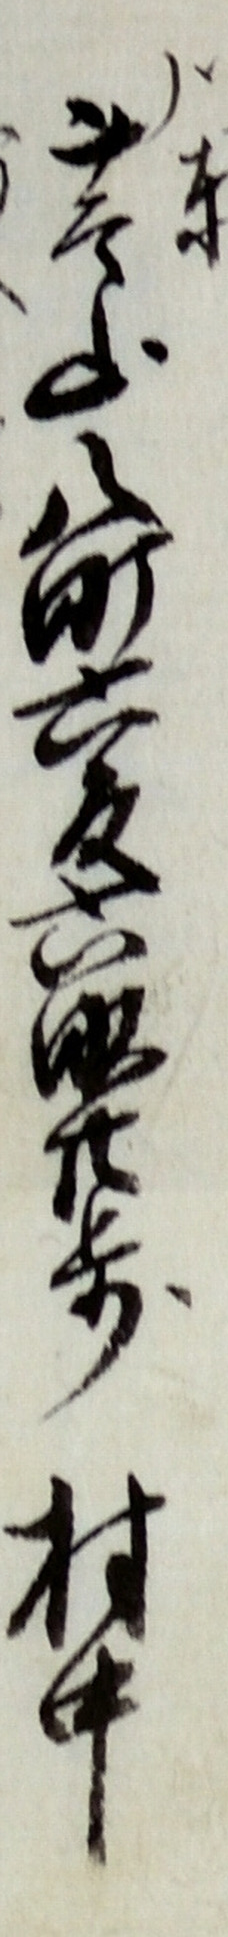芝山八町六反六畝廿歩村中
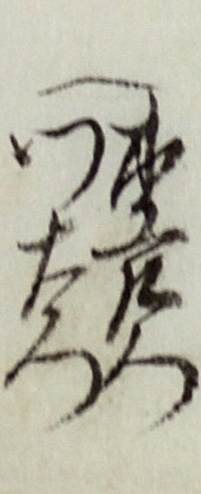杢左衛門

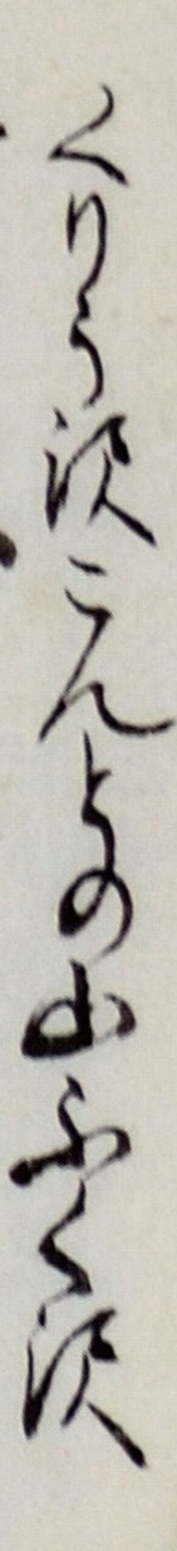くりう沢こんとの山ふく沢
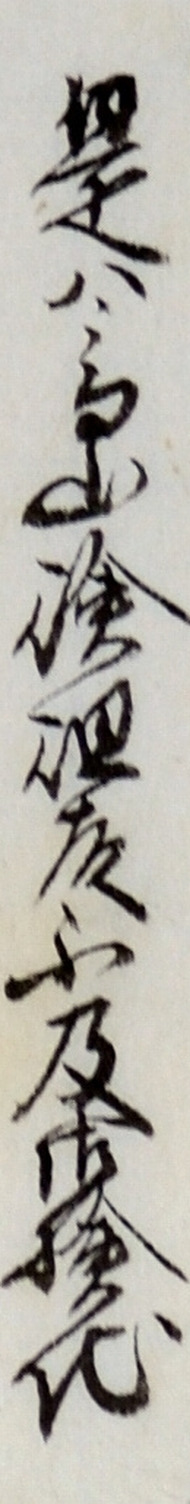是ハ高山嶮阻故不及御検地
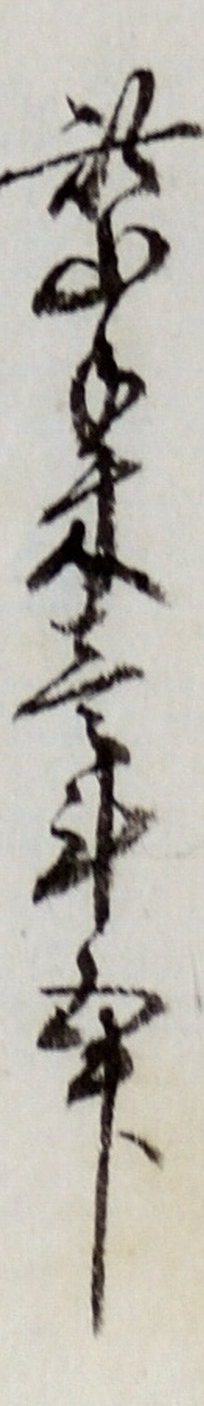此山手米壱斗五升
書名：御領分中山林社地手控
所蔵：伊那市立高遠町図書館・合同会社AMANE
